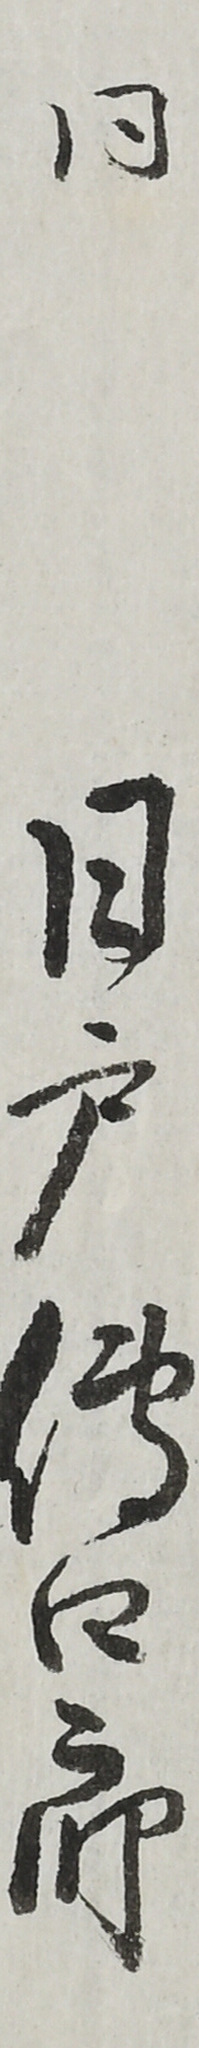同日戸伝四郎
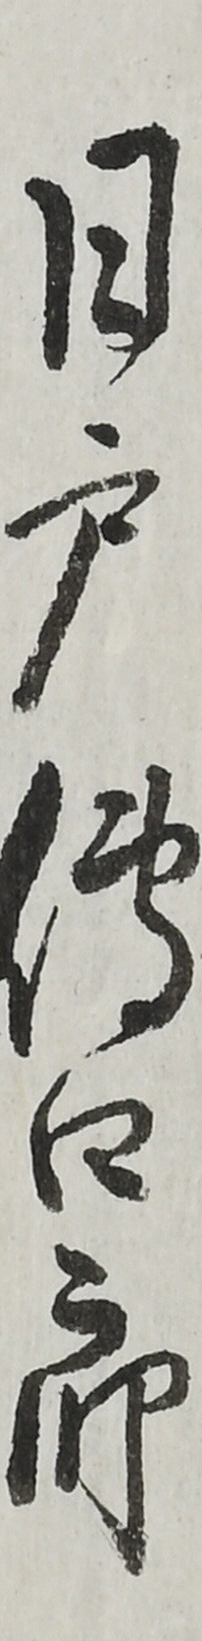同日戸伝四郎
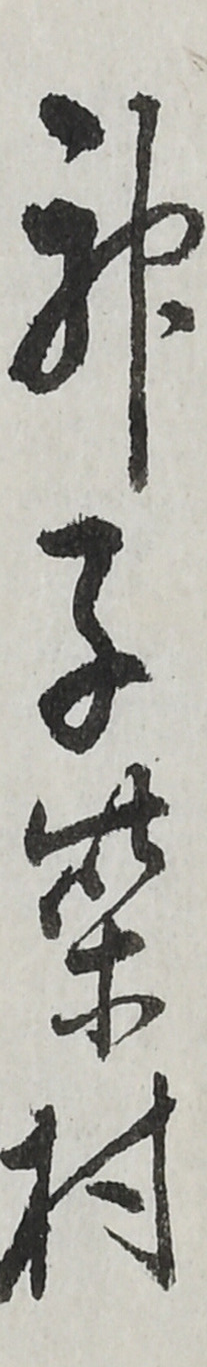神子柴村
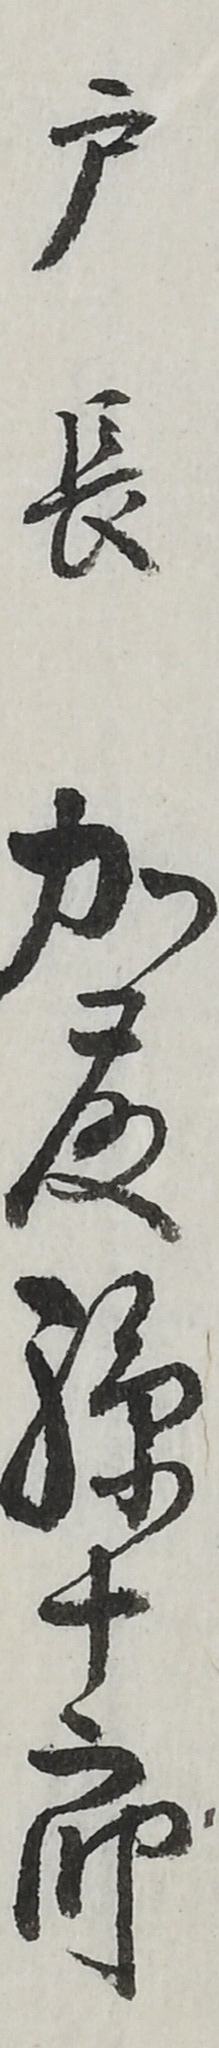戸長加藤孫十郎

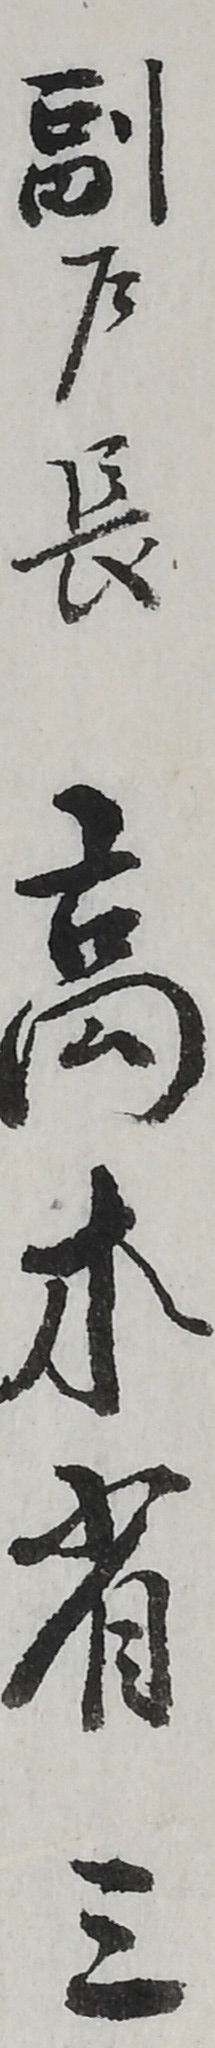副戸長高木省三
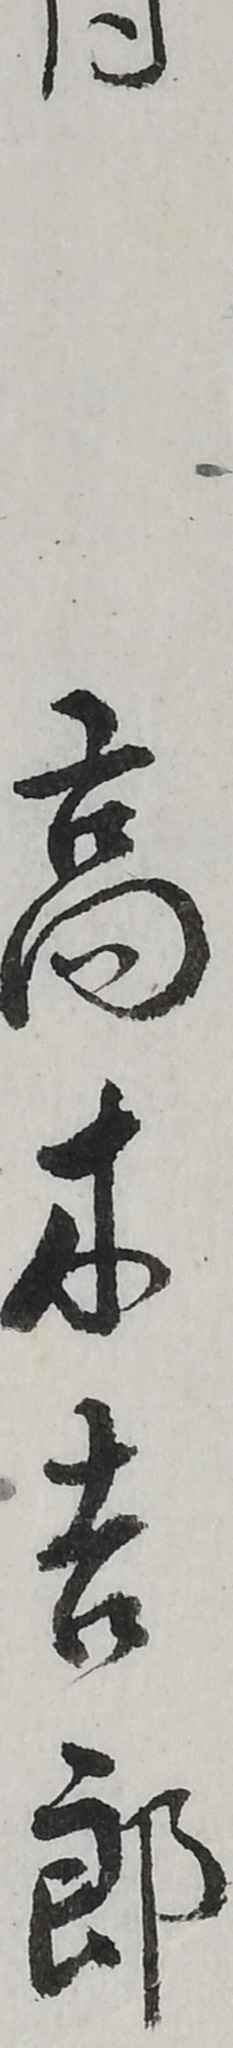同高木吉郎
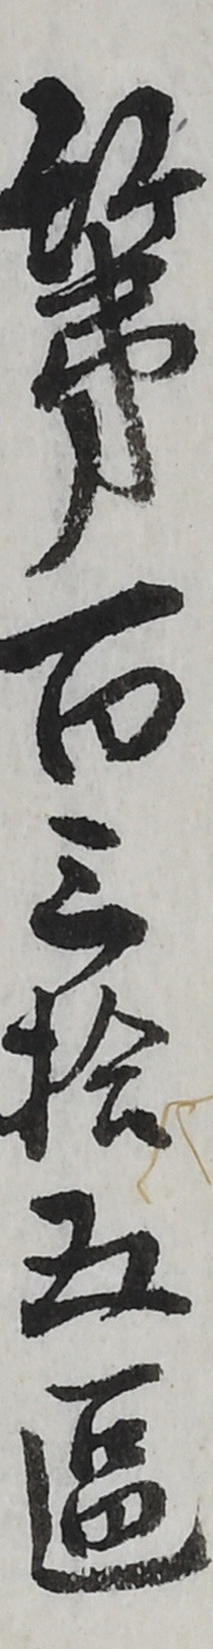第百三拾五区
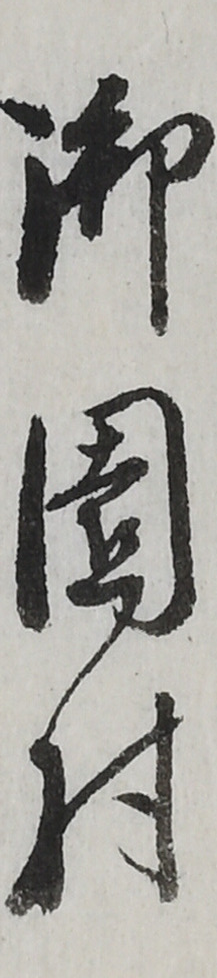御園村
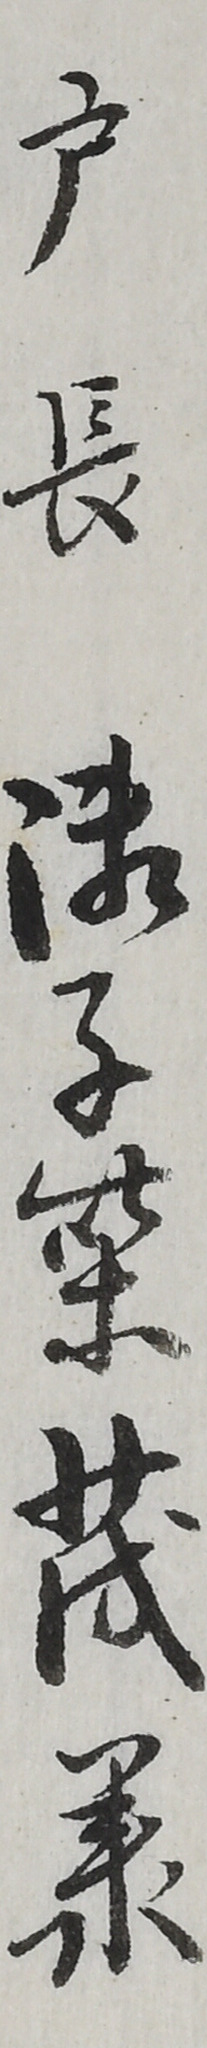戸長御子柴茂承
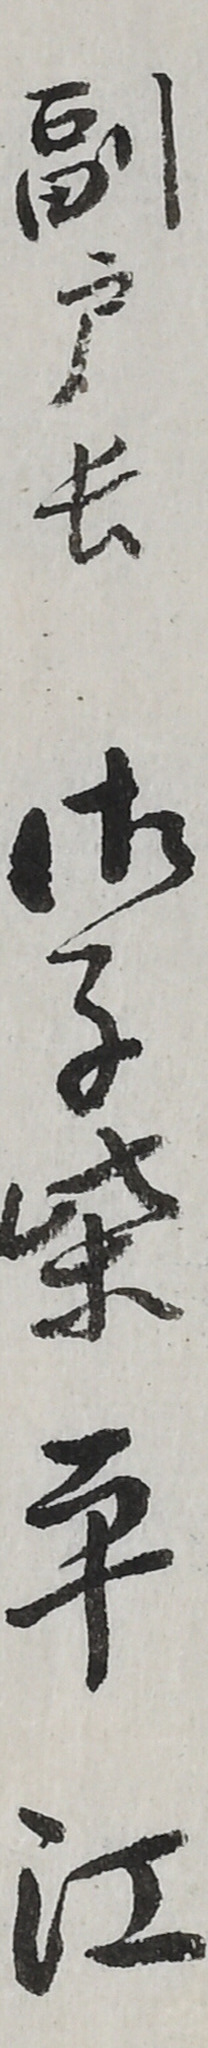副戸長御子柴平江
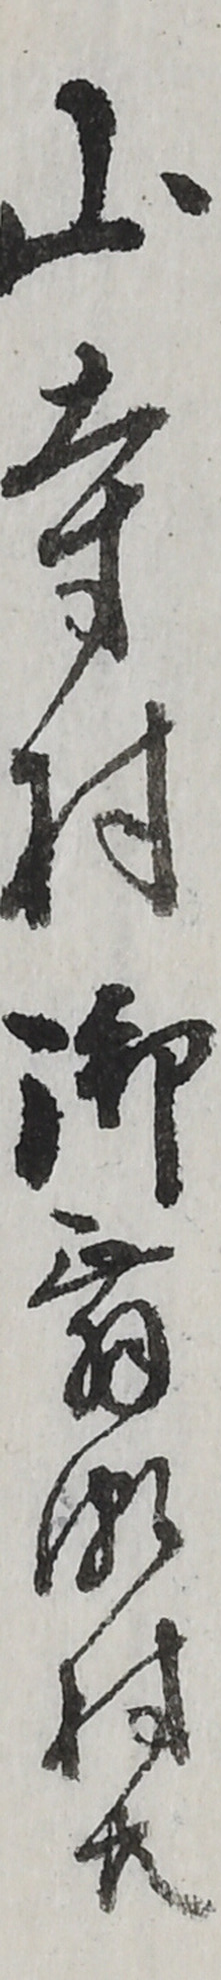山寺村御舞瀬村共
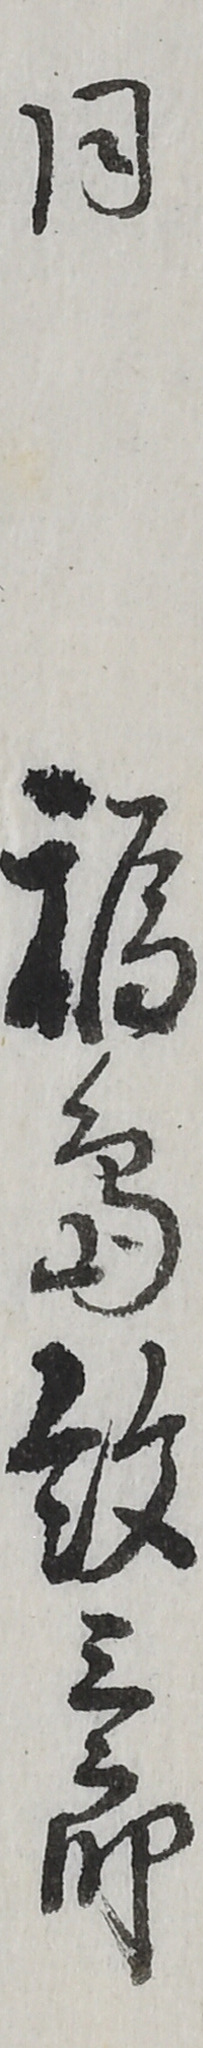同福島紋三郎
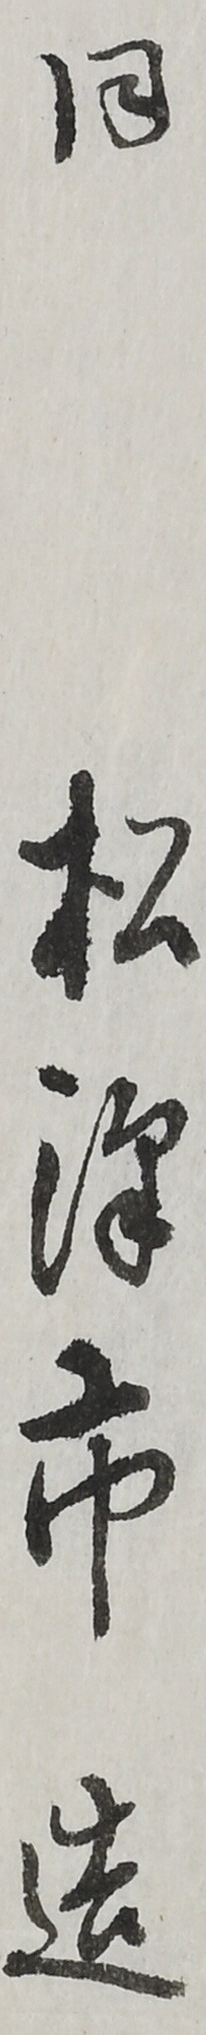同松澤市造
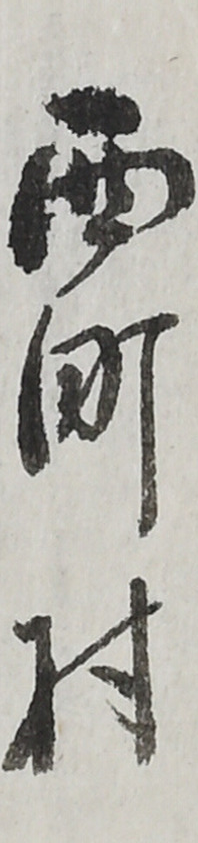西町村
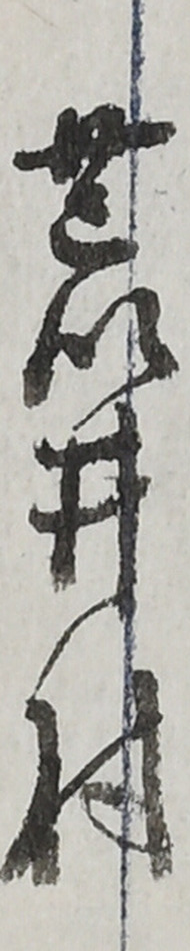荒井村
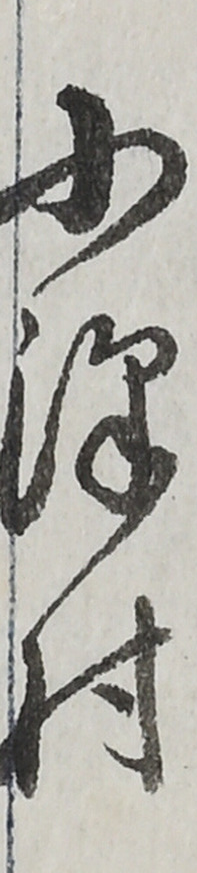小澤村
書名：伊那郡毎村戸長副戸長名簿
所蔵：伊那市立高遠町図書館・合同会社AMANE
